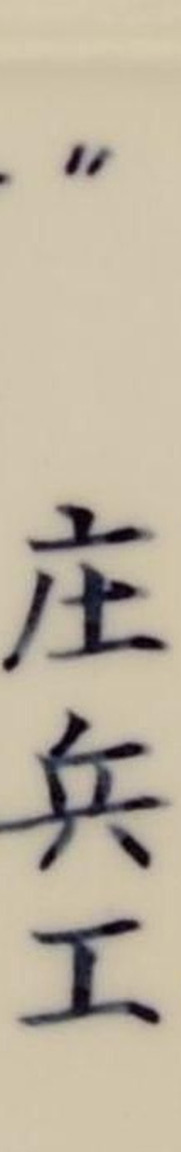庄兵エ
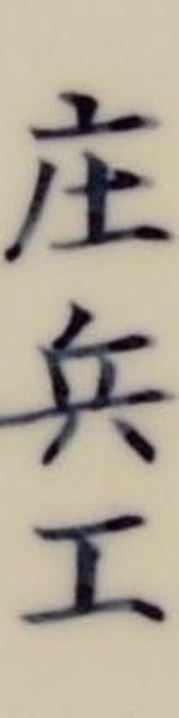庄兵エ
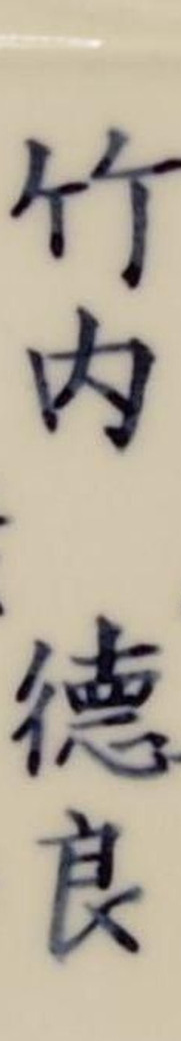竹内徳良
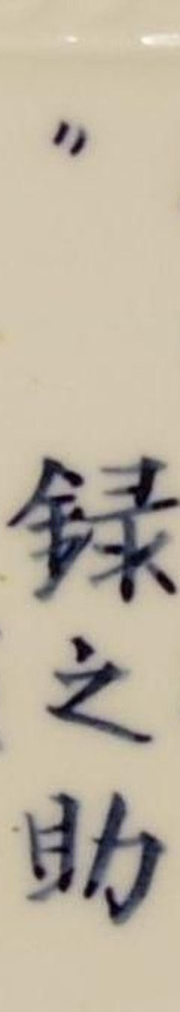録之助
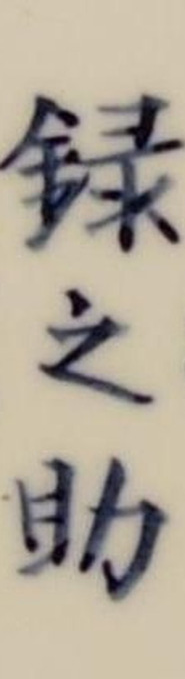録之助
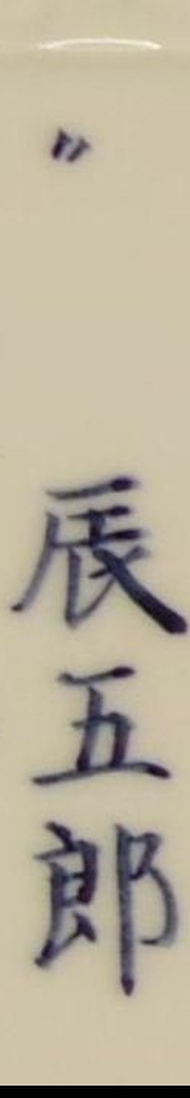辰五郎
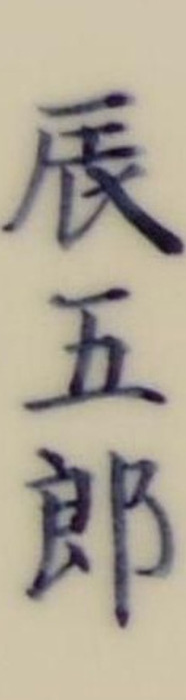辰五郎
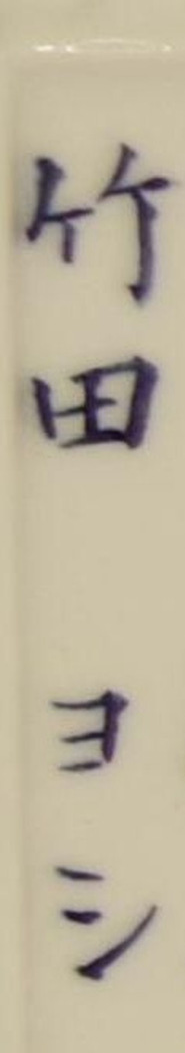竹田ヨシ

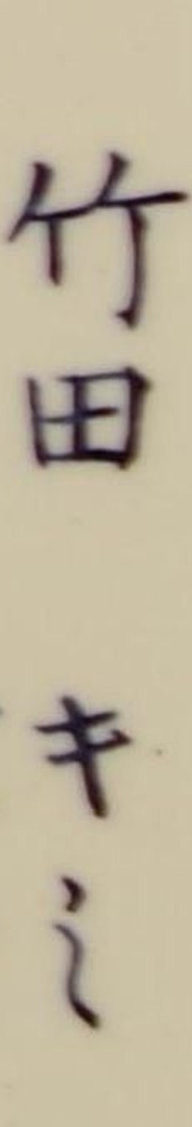竹田キミ
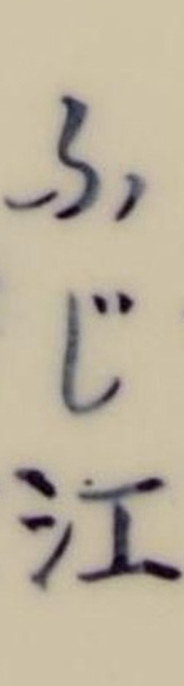ふじ江
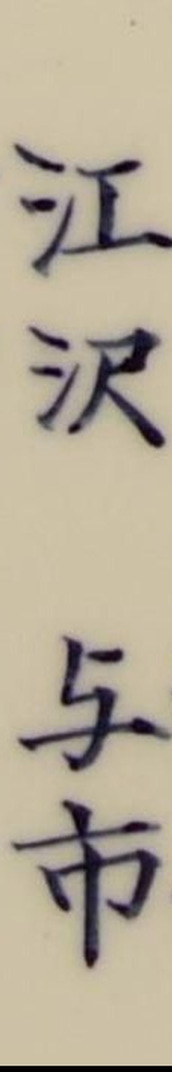江沢与市
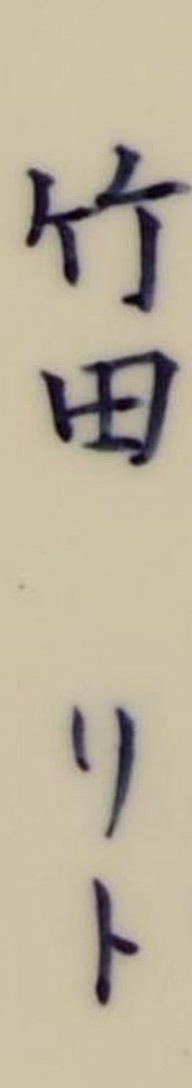竹田リト
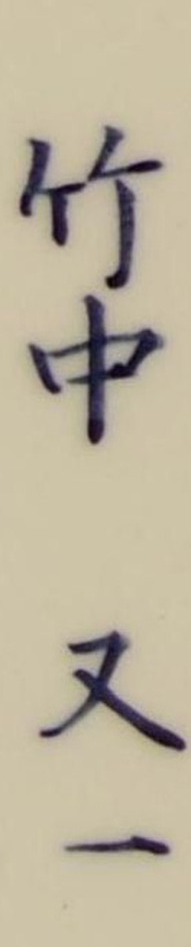竹中又一
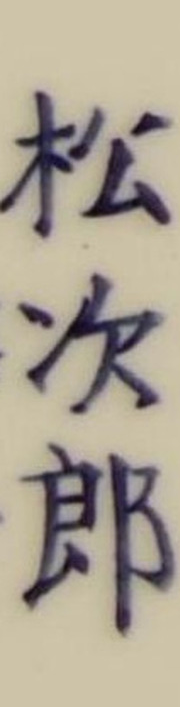松次郎

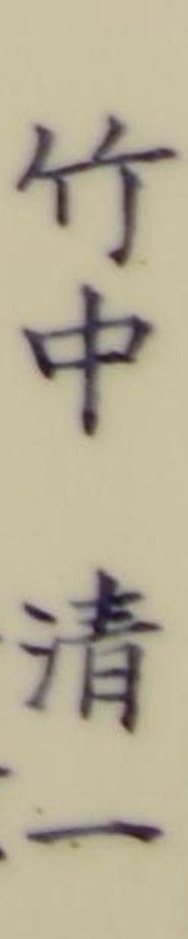竹中清一
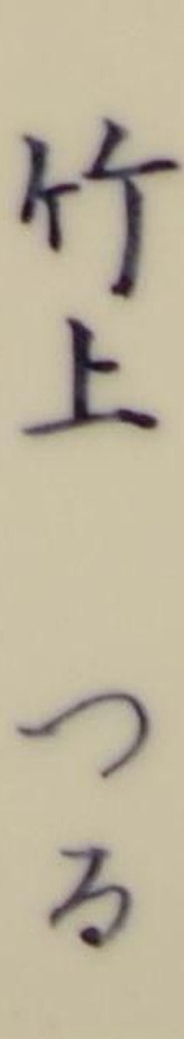竹上つる
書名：E~L
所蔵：高野山金剛峯寺
